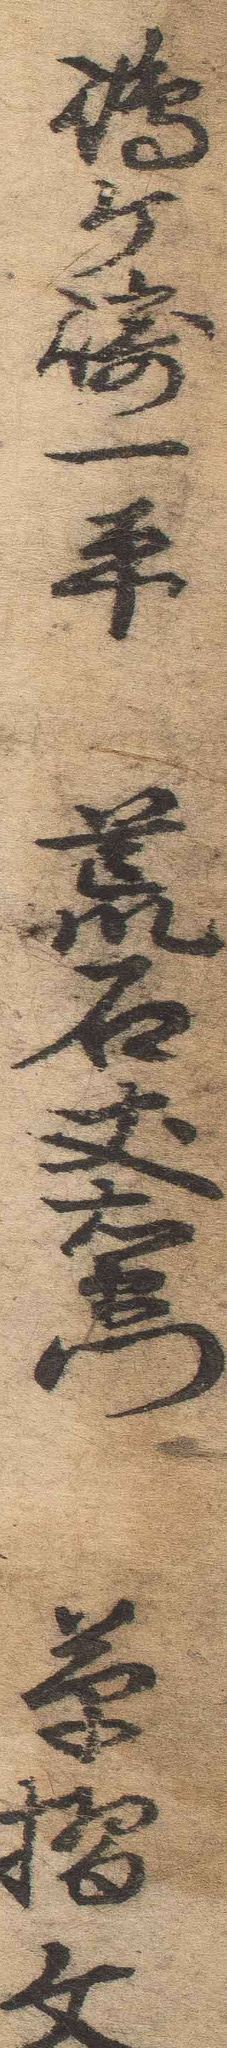嶋ケ崎一平荒石丈右衛門草摺文七
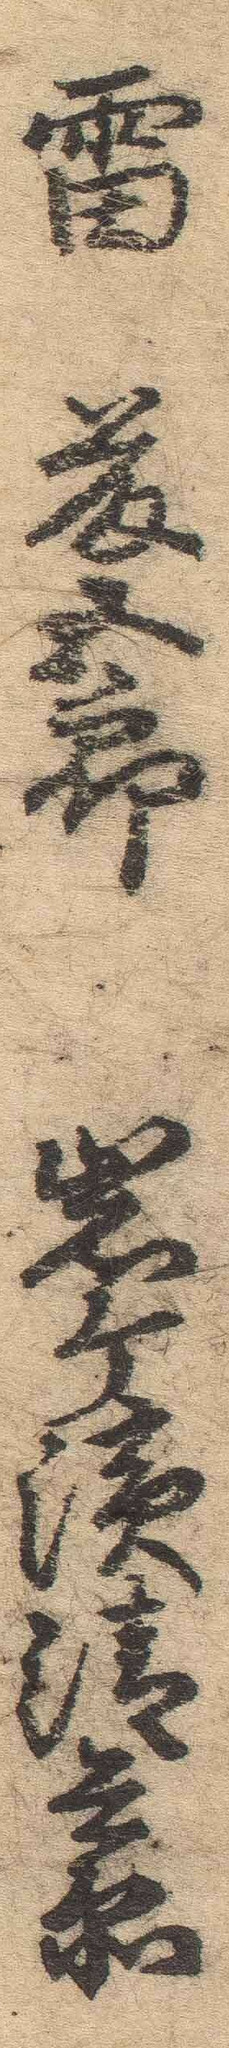雷藤五郎岩ケ浜清兵衛
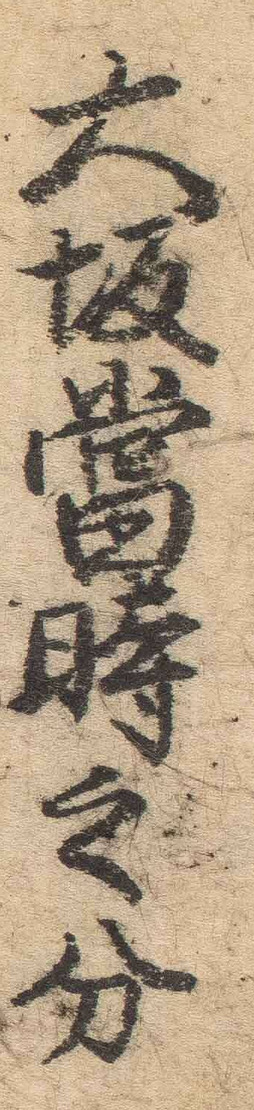大阪当時之分
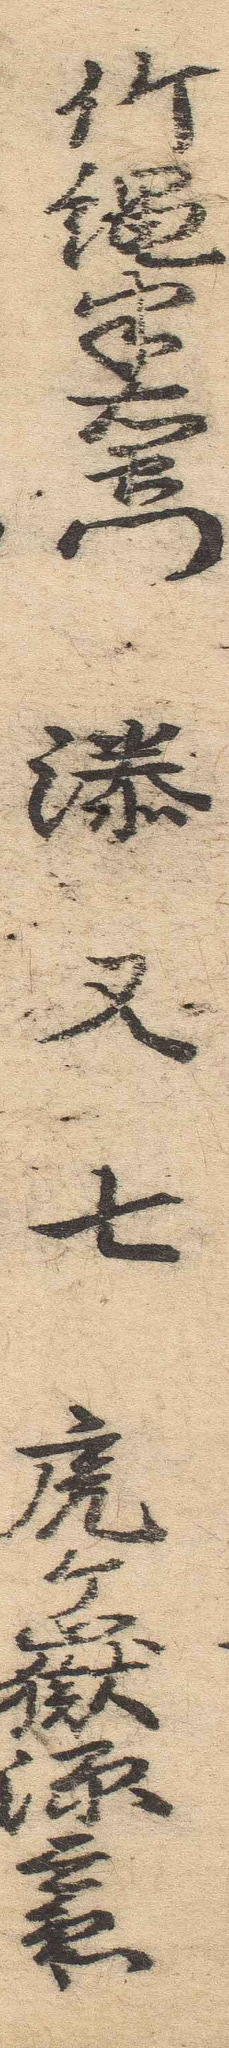竹縄半右衛門湊又七虎ケ嶽源兵衛
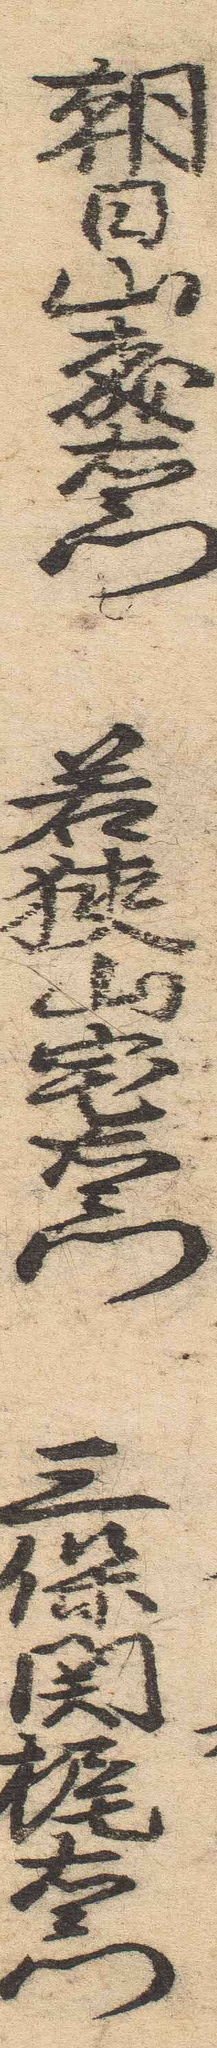朝日山森右衛門若狭山宅右衛門美保関梶右衛門
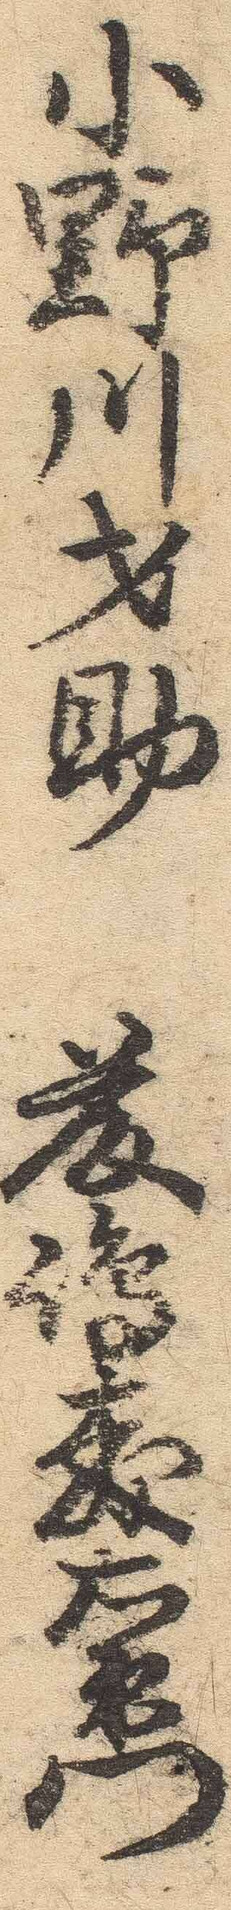小野川才助藤嶋森右衛門
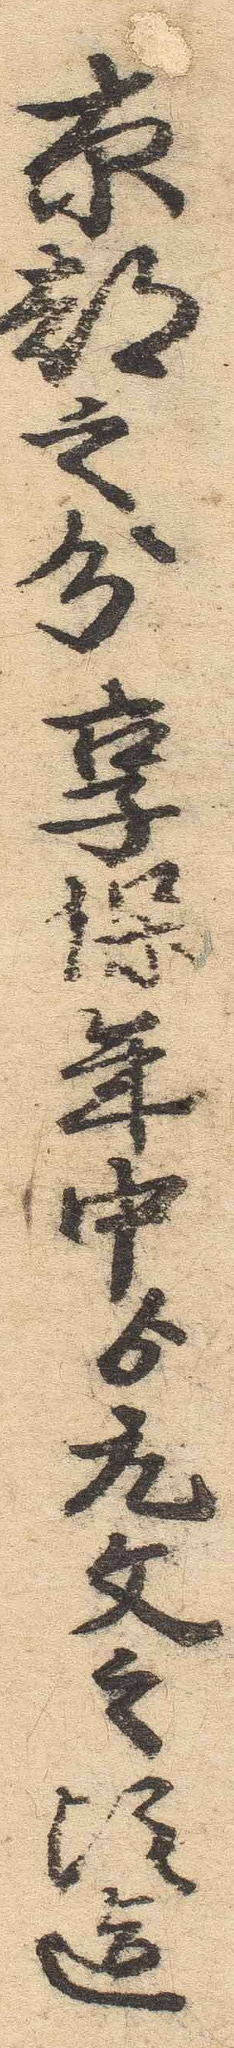京都之分享保年中ゟ元文之頃迄
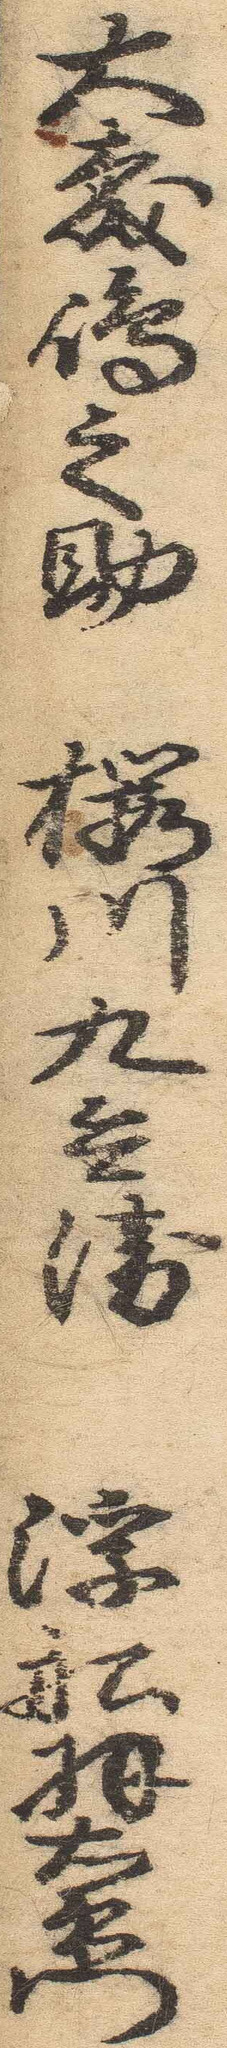大森伝之助桜川九兵衛浮船扨右衛門
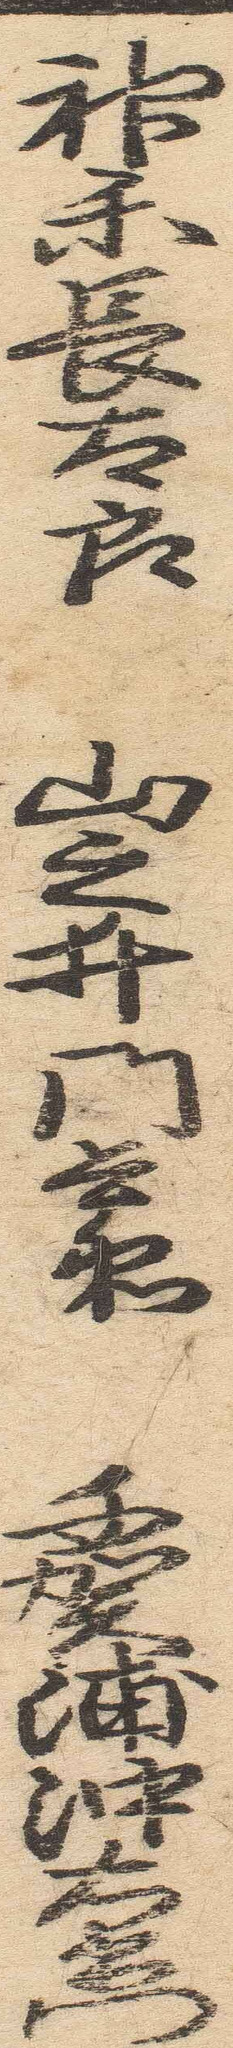神楽長太郎山之井門兵衛千賀浦沖右衛門
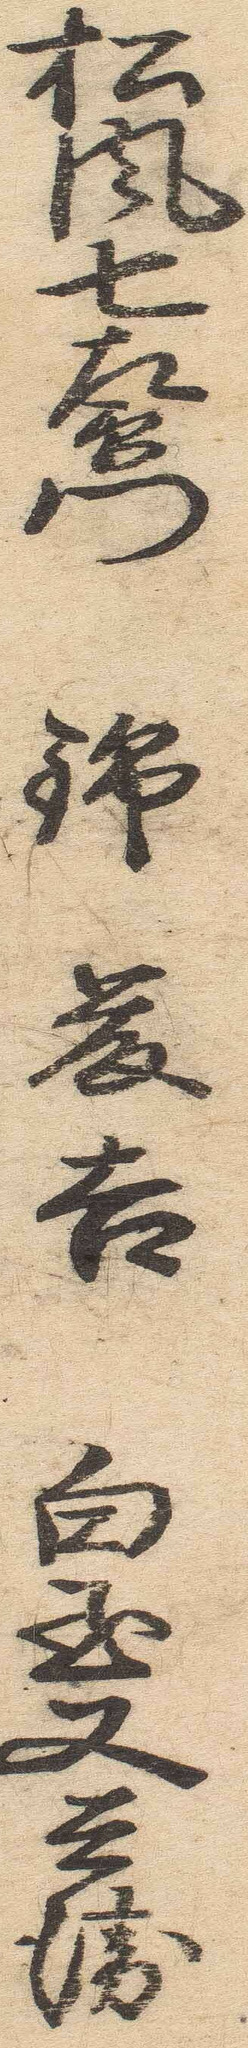松風七左衛門錦藤吉白玉又兵衛
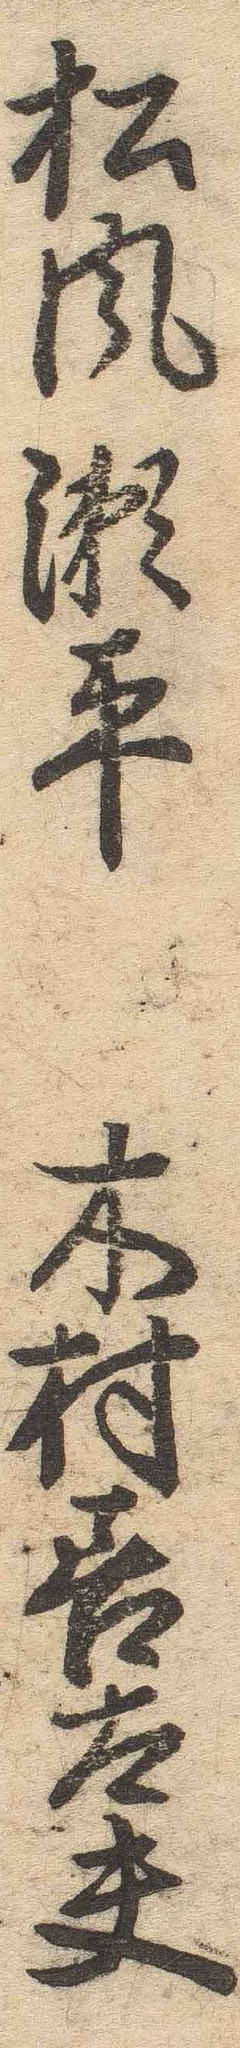松風瀬平木村善太夫
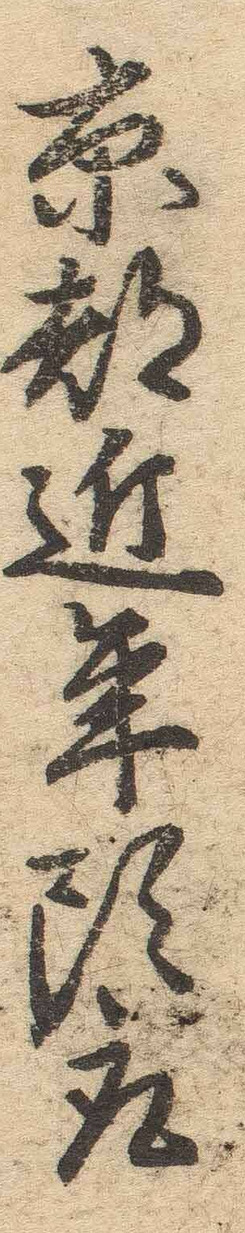京都近年頭取
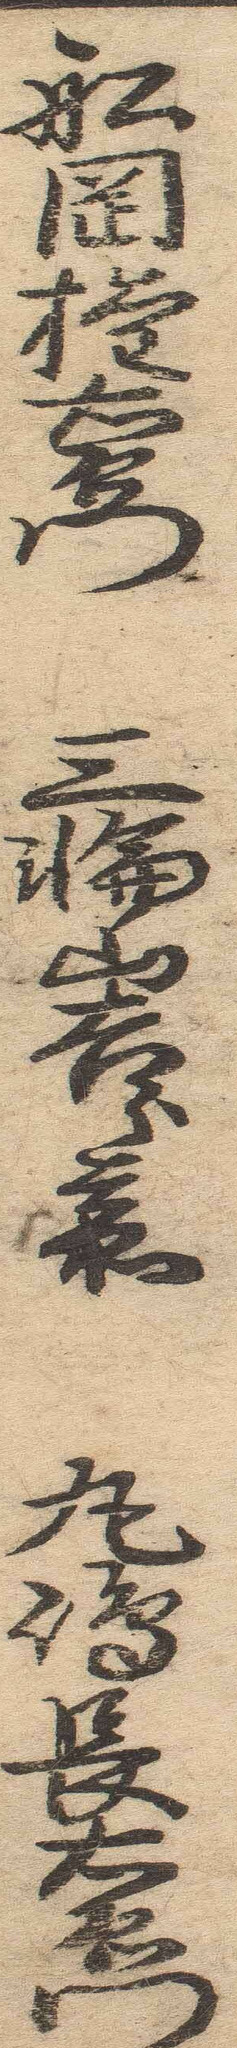船岡権右衛門三輪山吉郎兵衛丸嶋長右衛門
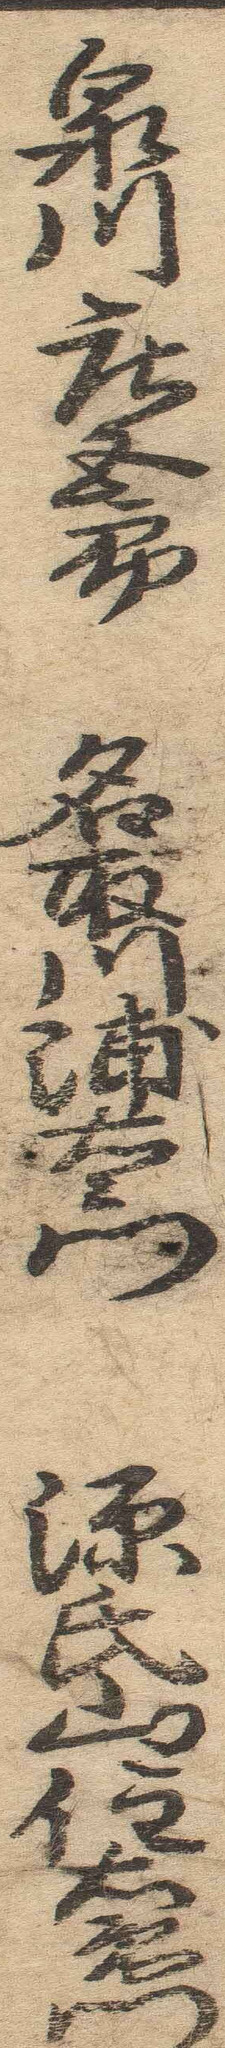泉川庄五郎名取川浦右衛門源氏山住右衛門
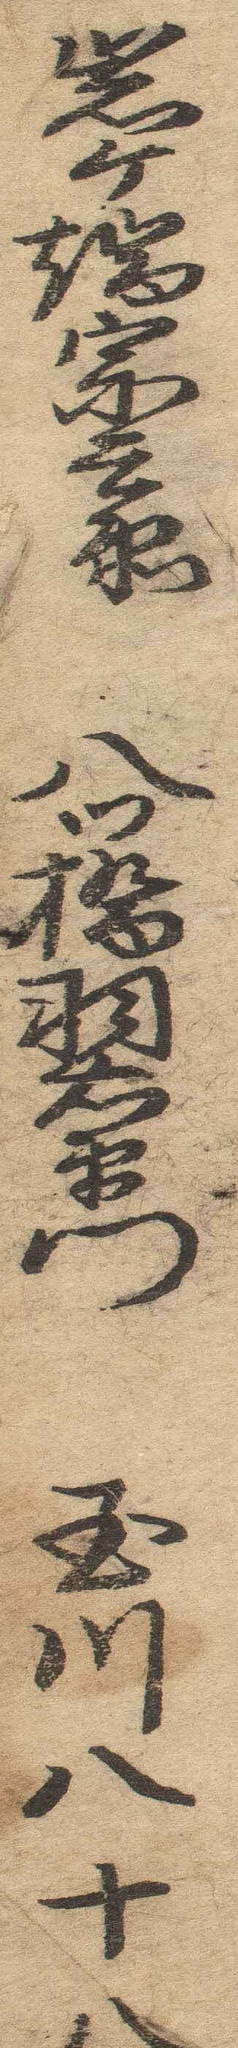岩ケ端宗兵衛八橋羽右衛門玉川八十八
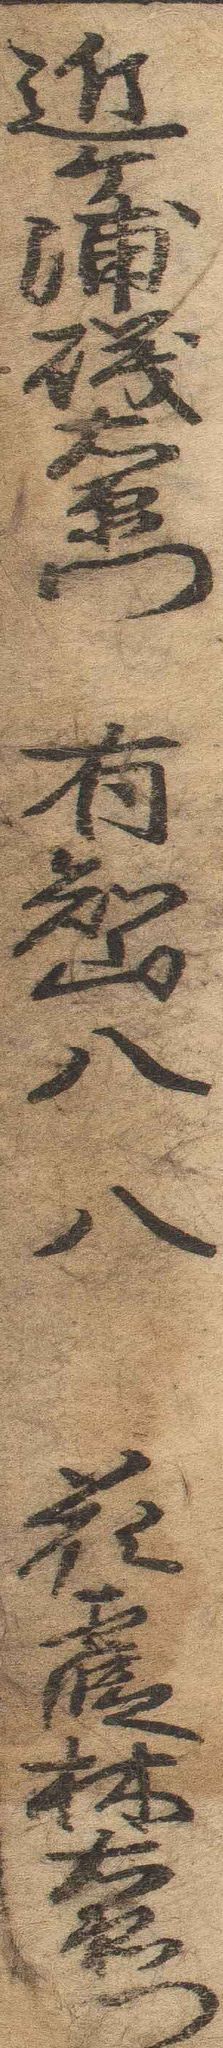近ケ浦磯右衛門有知山八八花霞林右衛門
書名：古今相撲大全
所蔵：東京学芸大学附属図書館 国文学研究資料館
